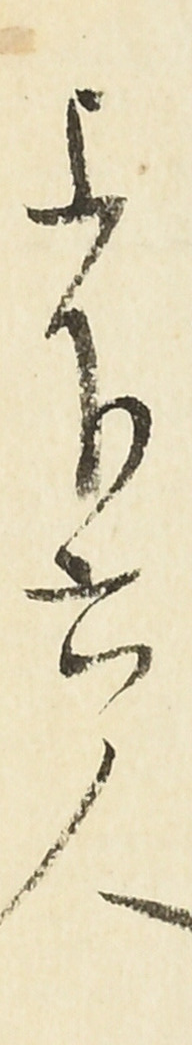上下六人

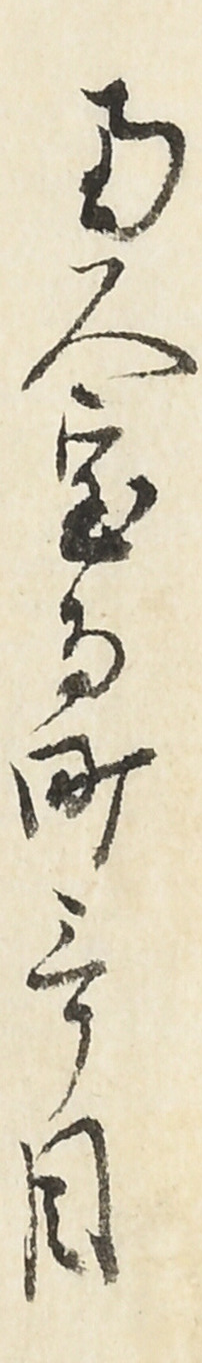南久宝寺町三丁目
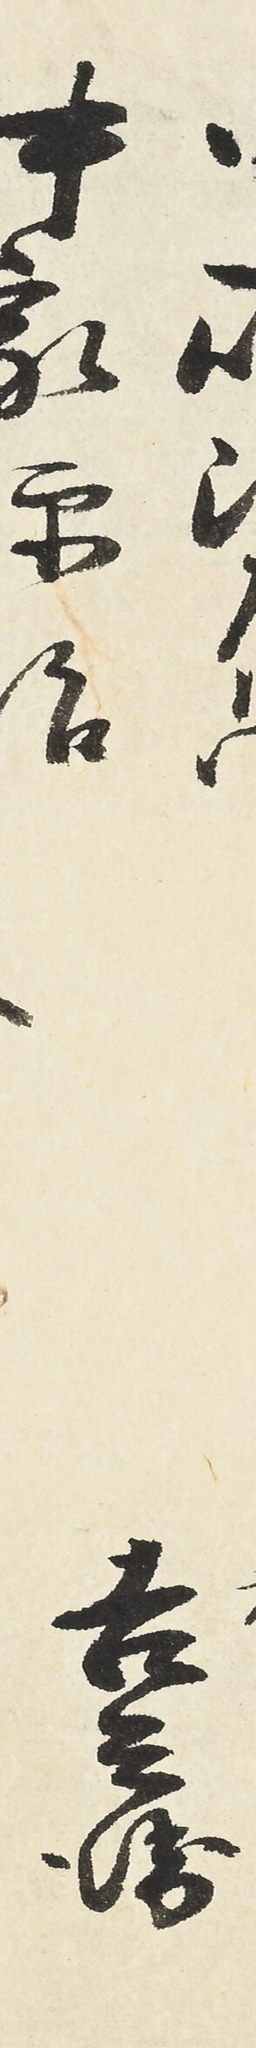中家源治吉兵衛
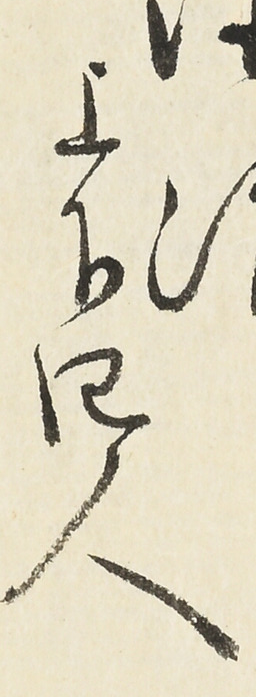上下四人
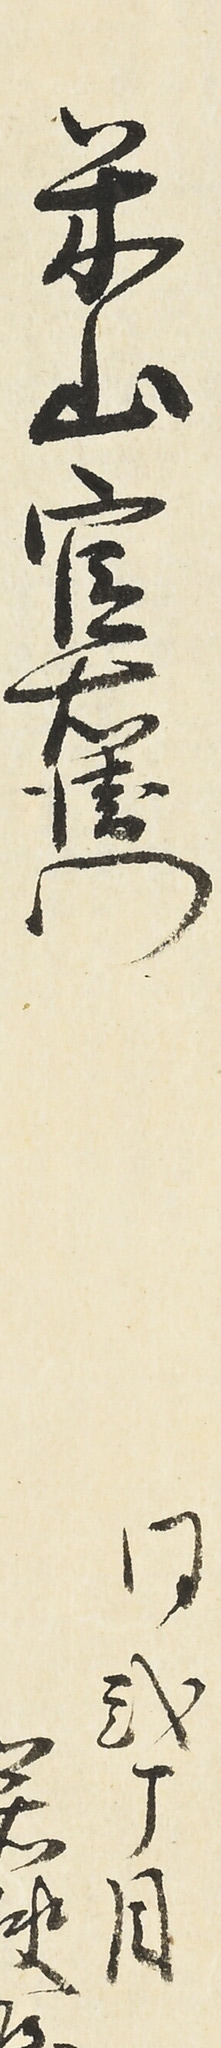米山官右衛門同弐丁目
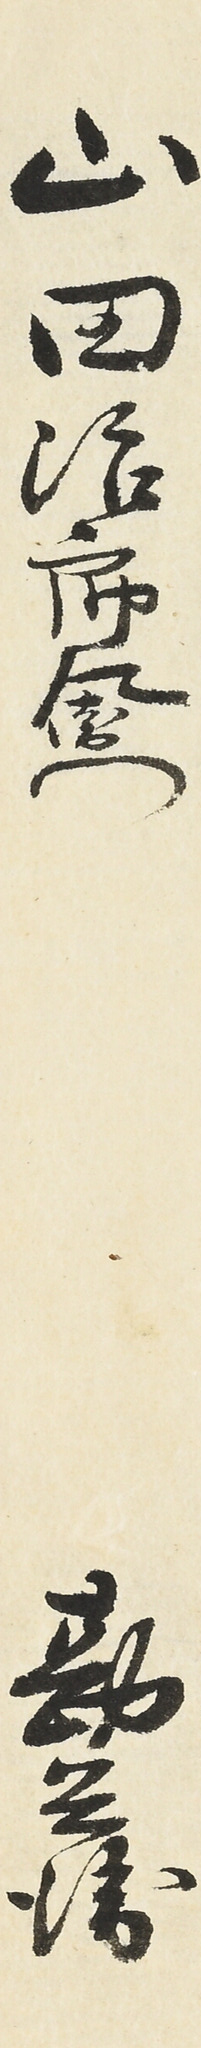・一山田治郎左衛門若狭屋
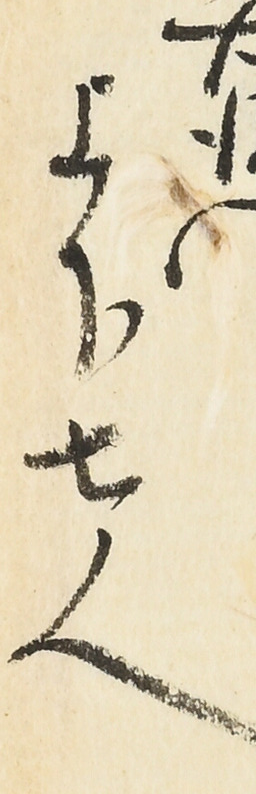上下七人
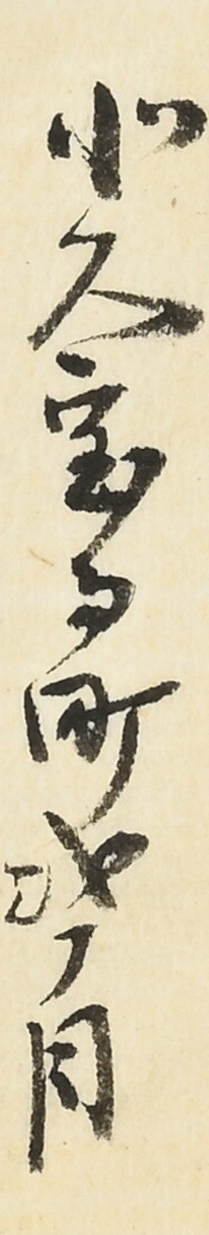北久宝寺町弐丁目
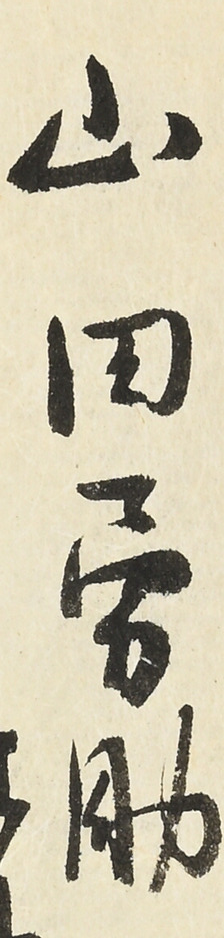山田勇助
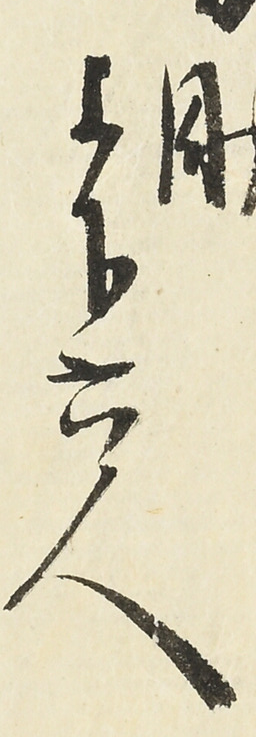上下六人
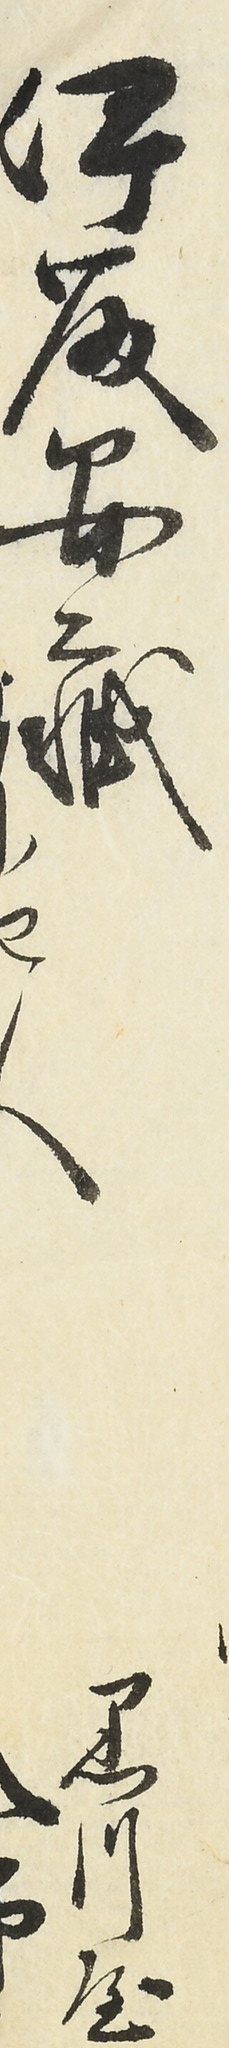伊藤安蔵黒川屋
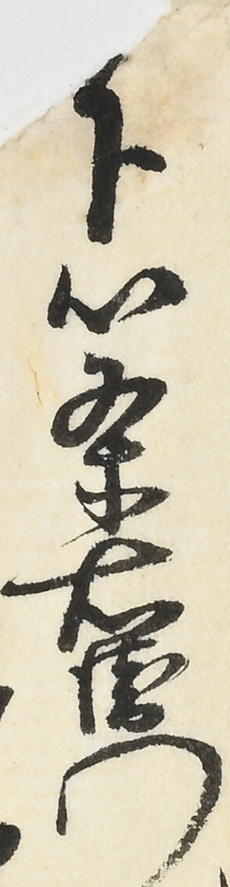下以条右衛門
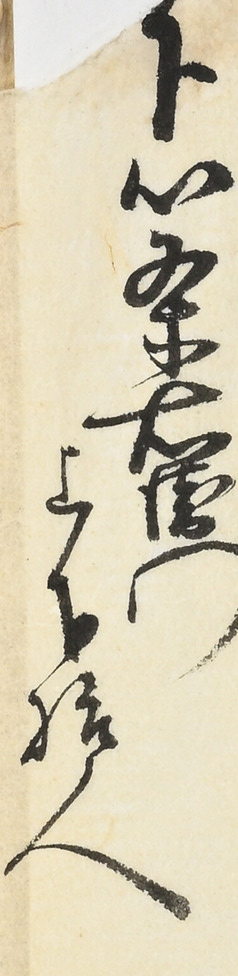下以条右衛門
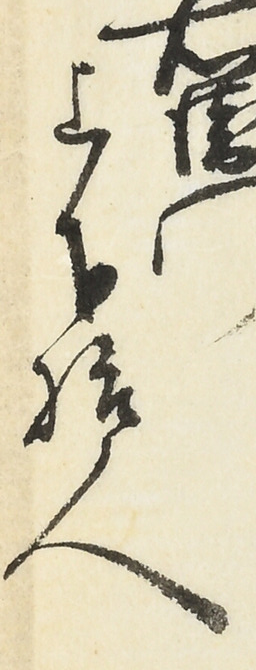上下拾人

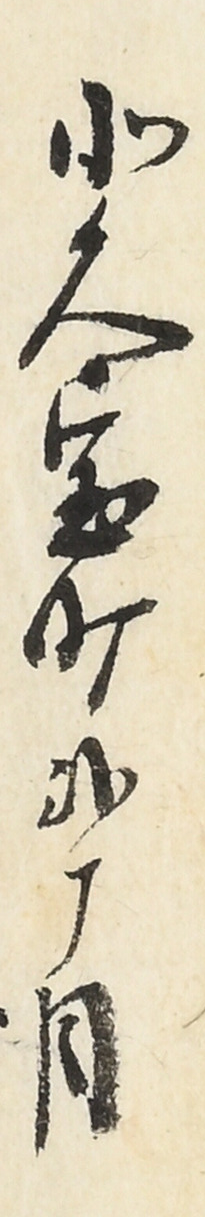北久宝町弐丁目
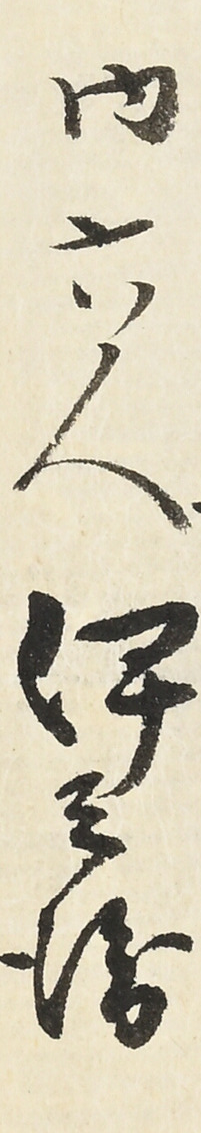内六人伊兵衛
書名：内藤大和守下宿割
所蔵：伊那市立高遠町図書館・合同会社AMANE
